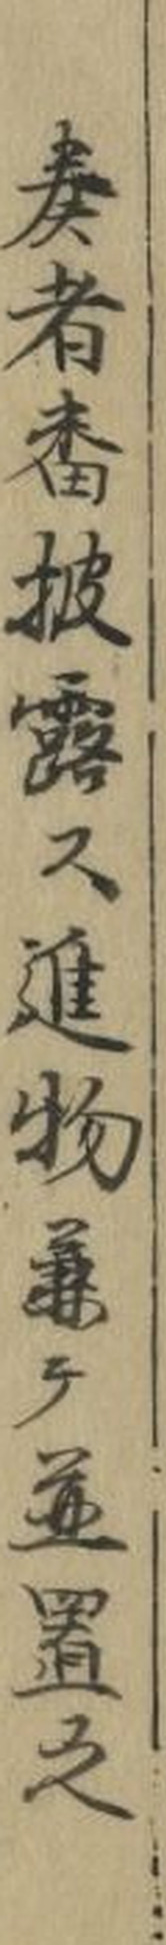奏者番披露ス進物兼テ並置之
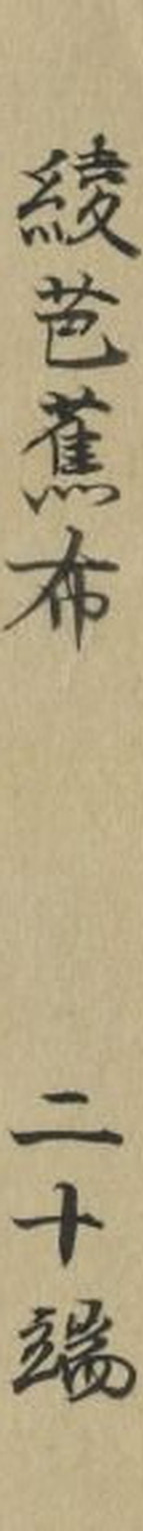綾芭蕉布二十端
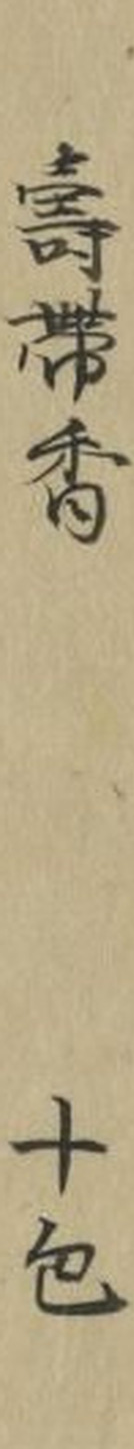寿帯香十包
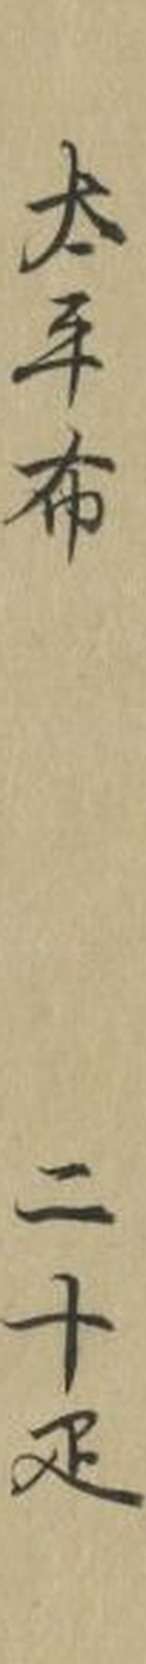大平布二十疋
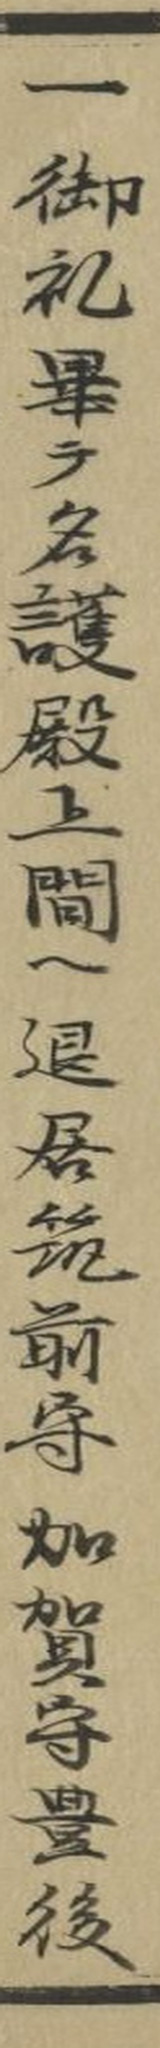一御礼畢テ名護殿上間へ退居筑前守加賀守豊後
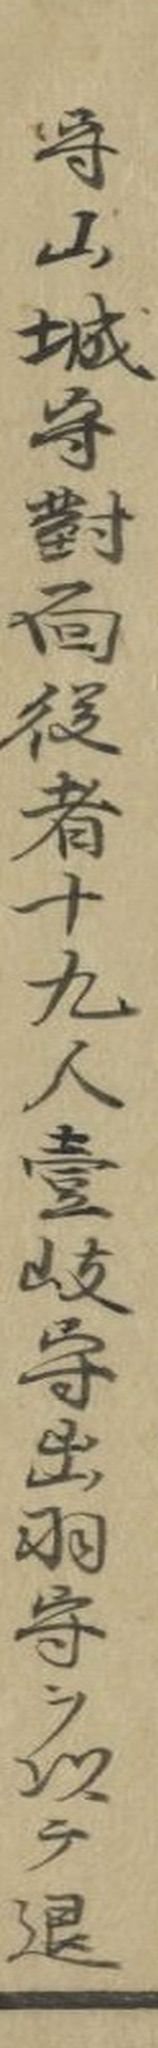守山城守対面従者十九人壱岐守出羽守ヲ以テ退
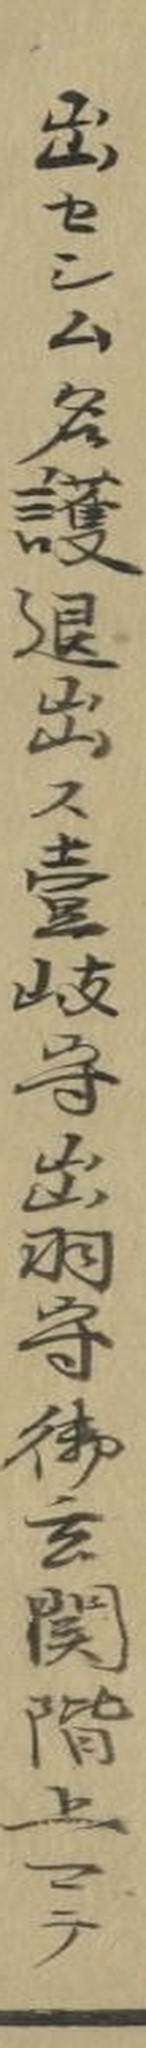出セシム名護退出ス壱岐守出羽守御玄関階上マテ
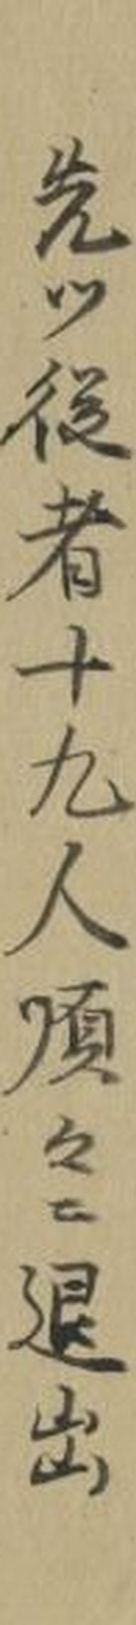先ツ従者十九人順々二退出
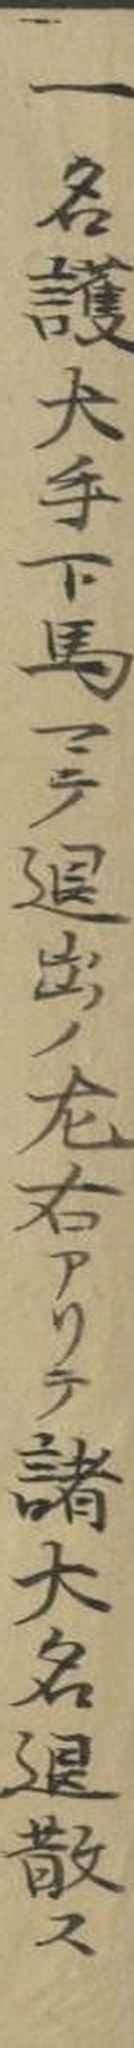一名護大手下馬マテ退出ノ左右アリテ諸大名退散ス
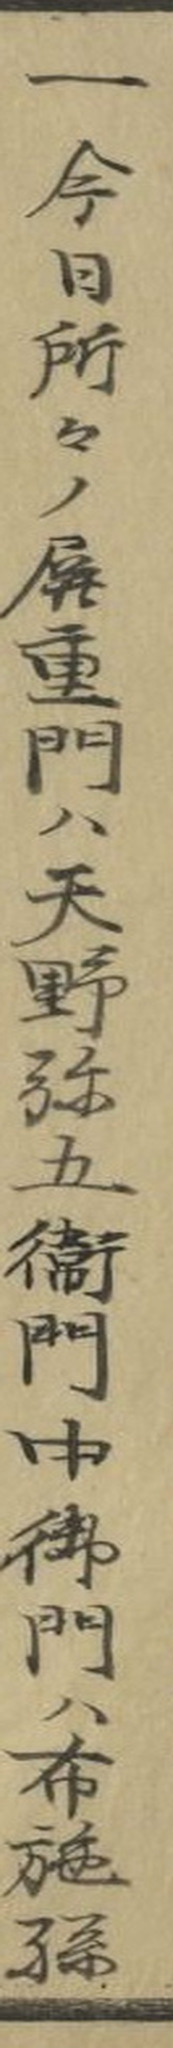一今日所々ノ屏重門ハ天野弥五衛門中御門ハ布施孫
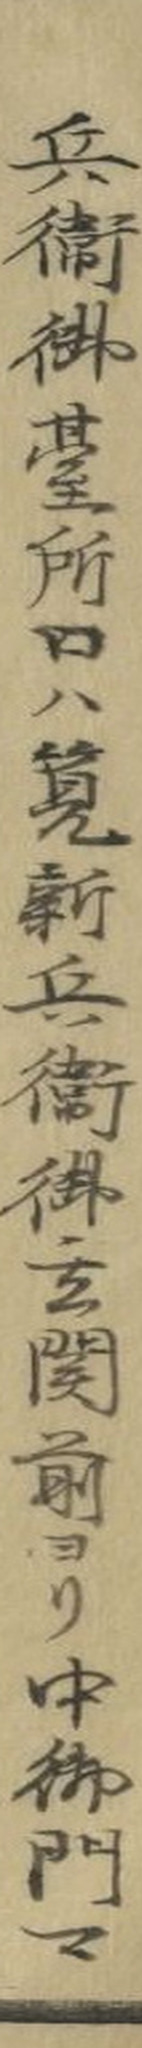兵衛御台所口ハ筧新兵衛御玄関前ヨリ中御門マ
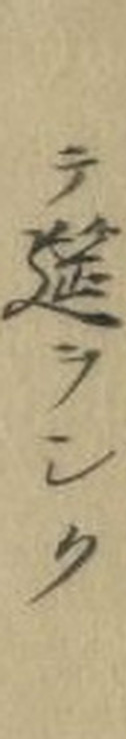テ莚ヲシク
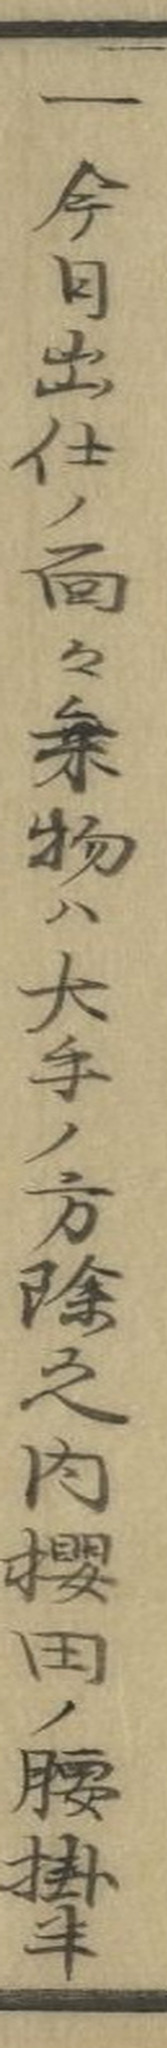一今日出仕ノ面々乗物ハ大手ノ方の除之内桜田ノ腰掛半
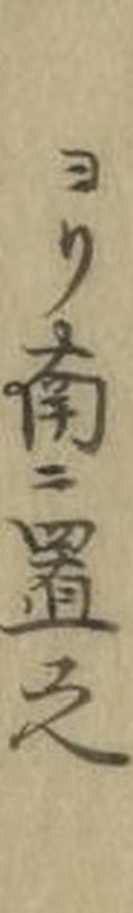ヨリ南二置之
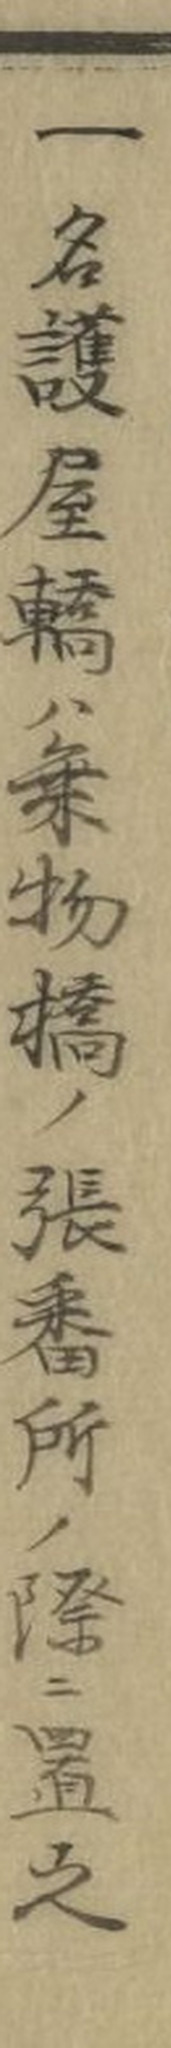一名護屋轎ハ乗物橋ノ張番所ノ際二置之
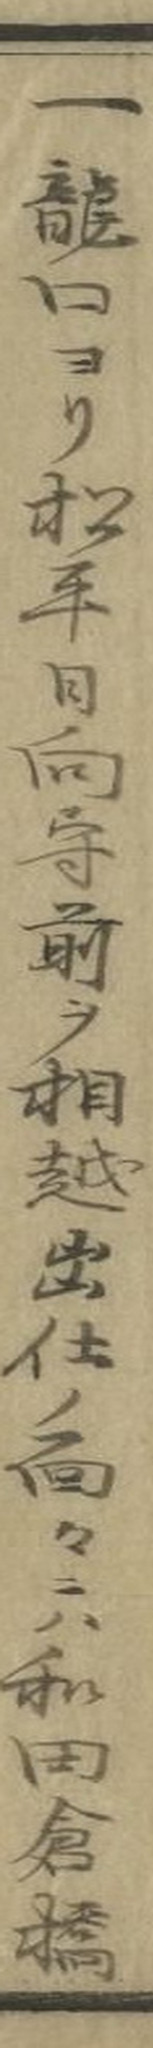一龍口ヨリ松平日向守前ヲ相越出仕ノ面々二ハ和田倉橋
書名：琉球往来（下）
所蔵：University of the Ryukyus Library
